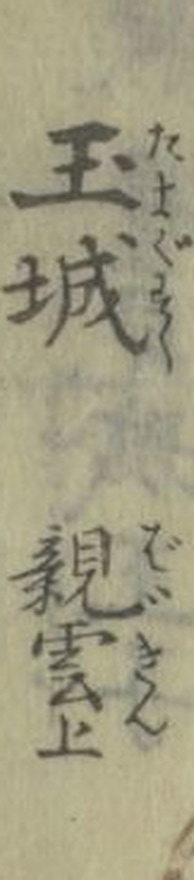玉城親雲上
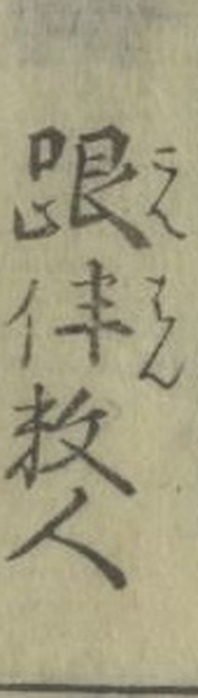跟伴数人
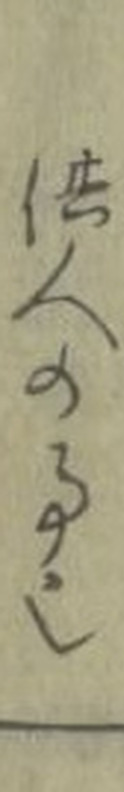供人の事也

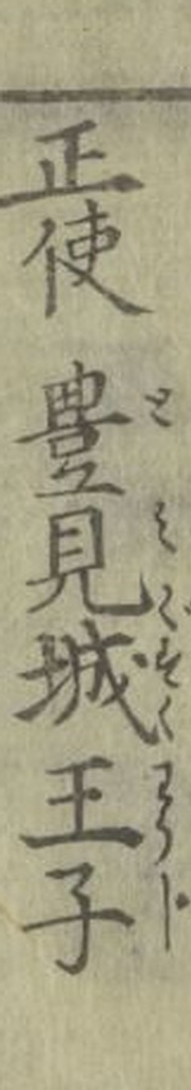正使豊見城王子
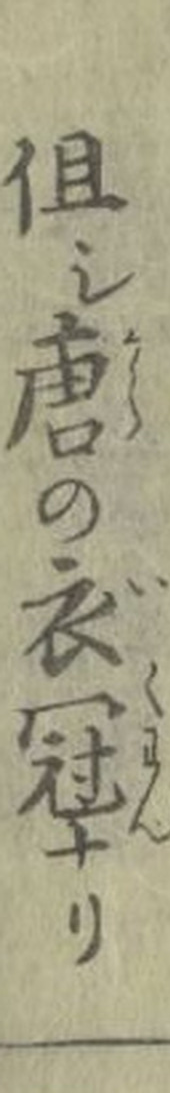但唐の衣冠ナリ
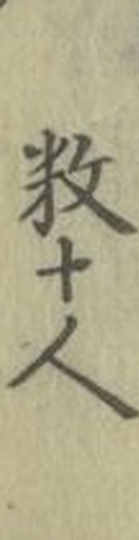数十人
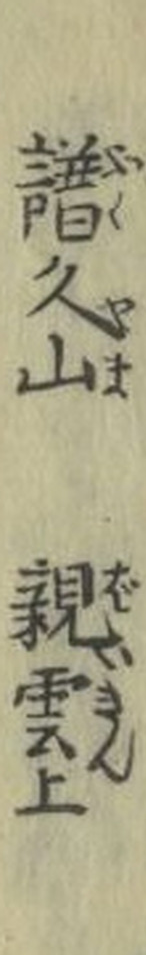譜久山親雲上
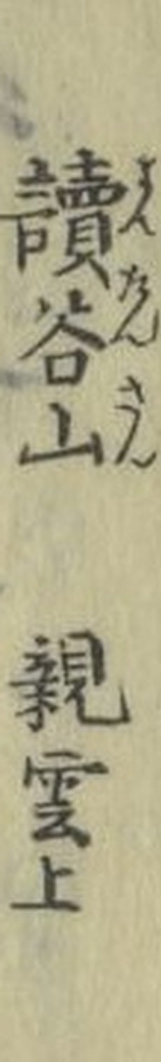讀谷山親雲上
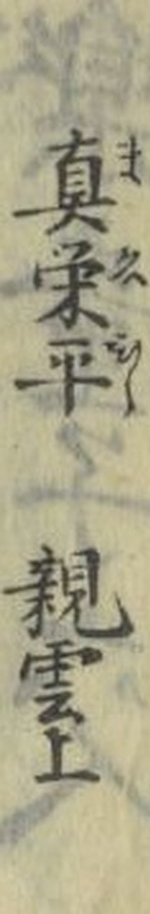真栄平親雲上
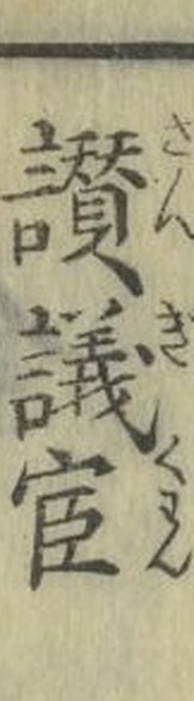讃議宦
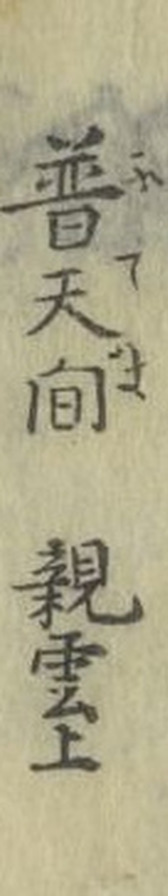普天間親雲上
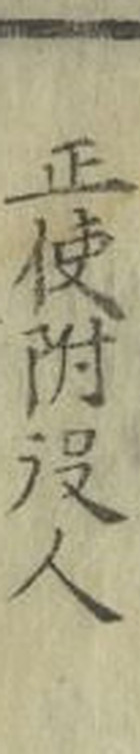正使附従人
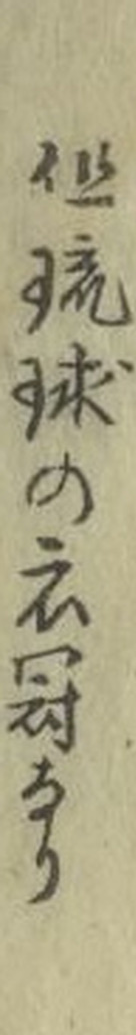但琉球の衣冠なり

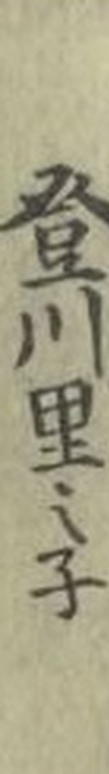登川里之子
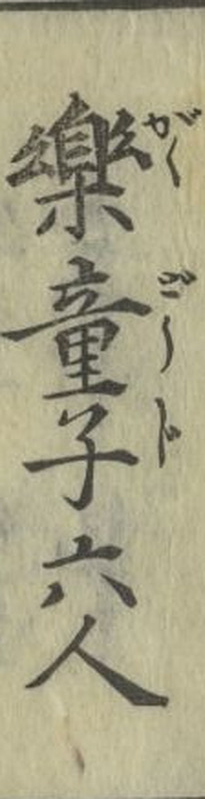樂童子六人
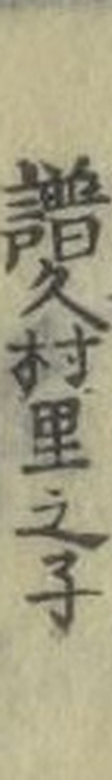譜久村里之子
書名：琉球人行列記
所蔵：University of the Ryukyus Library
